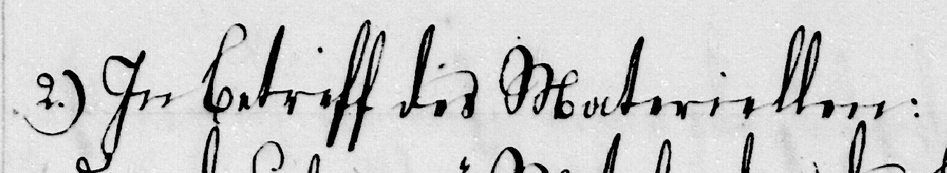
2.) In Betreff des Materiellen:
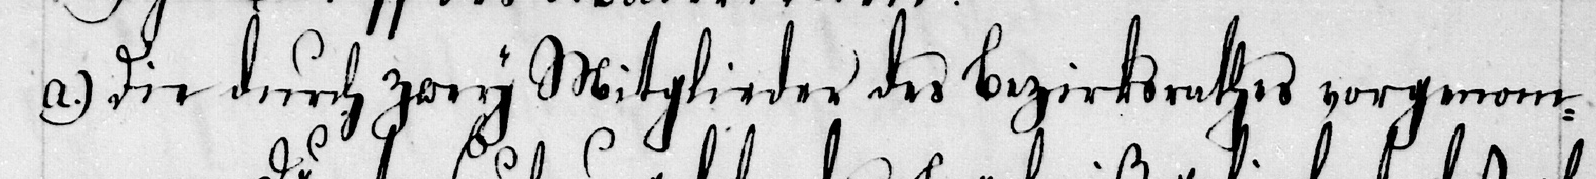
a.) Die durch zwey Mitglieder des Bezirksrathes vorgenom¬
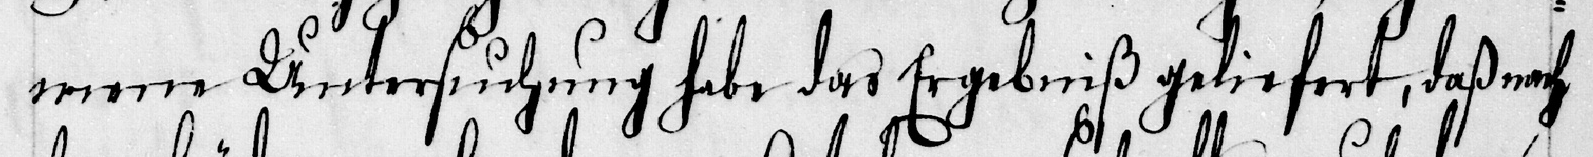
mene Untersuchung habe das Ergebniß geliefert, daß nach
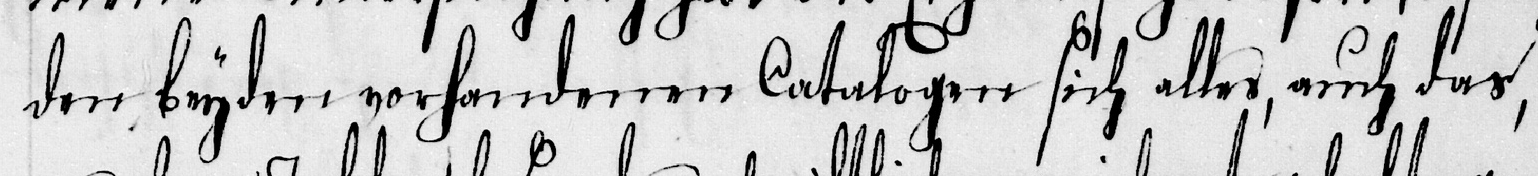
den beyden vorhandenen Catalogen sich alles, auch das,
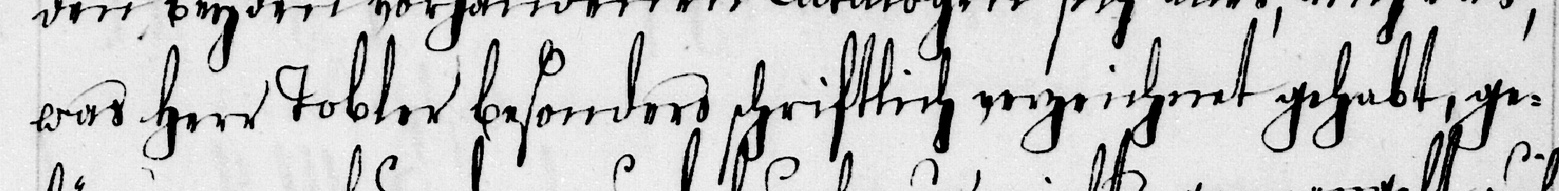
was Herr Tobler besonders schriftlich verzeichnet gehabt, ge¬
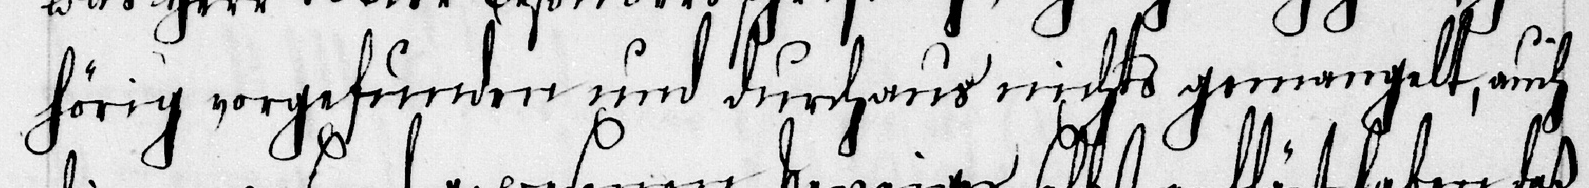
hörig vorgefunden und durchaus nicht gemangelt, auch
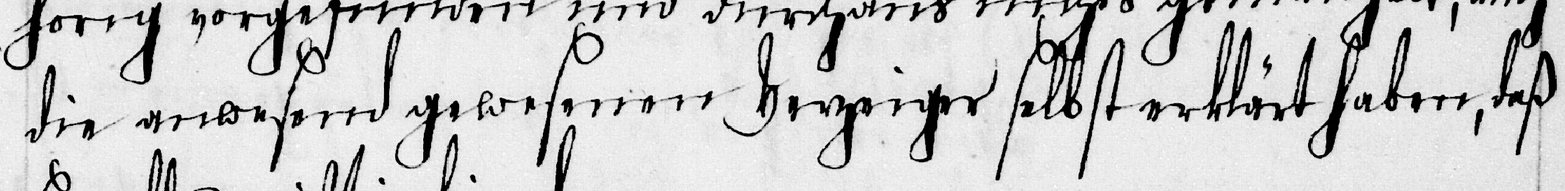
die anwesend gewesenen Verzeiger selbst erklärt haben, daß
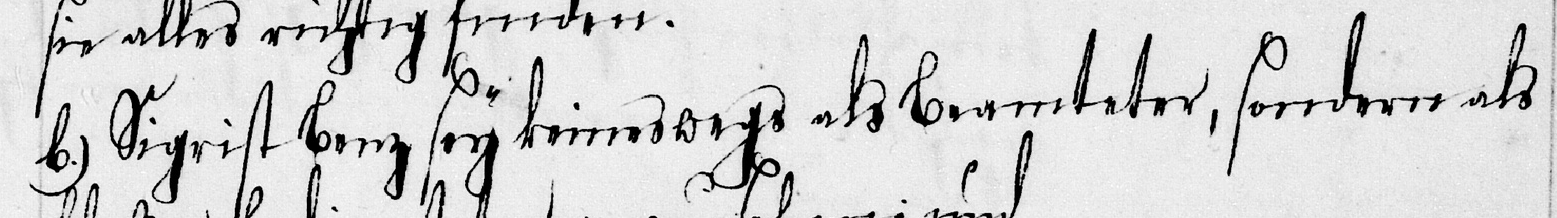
b,) Sigrist Benz sey keineswegs als Beamteter, sondern als
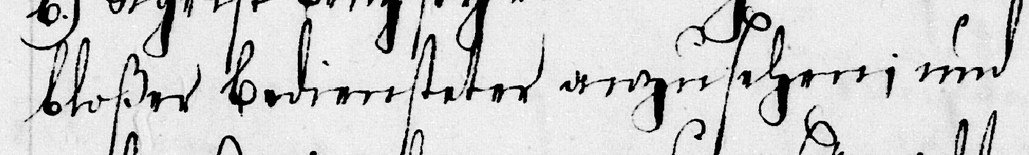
bloßer Bediensteter anzusehen; und
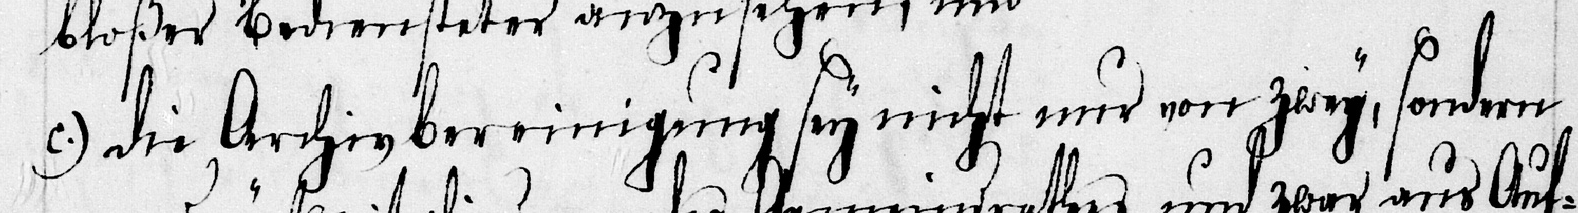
c.) die Archivbereinigung sey nicht nur von zwey, sondern
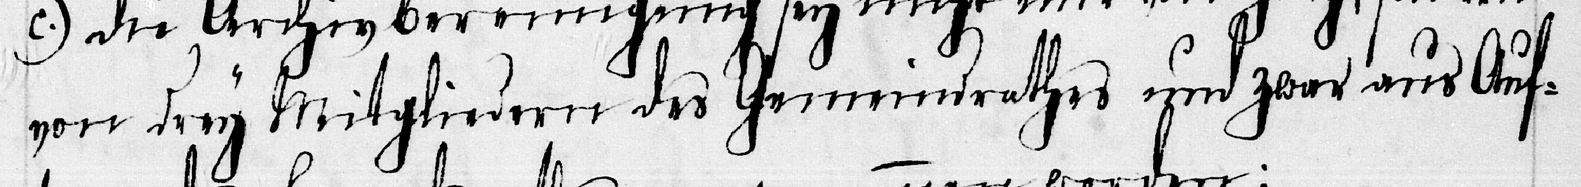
von drey Mitgliedern des Gemeindrathes und zwar aus Auf¬
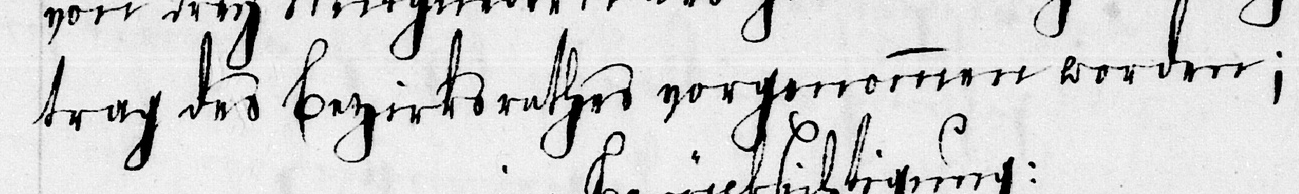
trag des Bezirksrathes vorgenommen worden;
